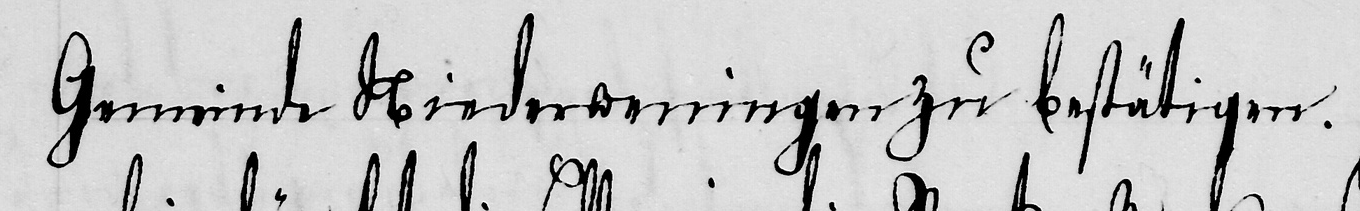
Gemeinde Niederweningen zu bestätigen.
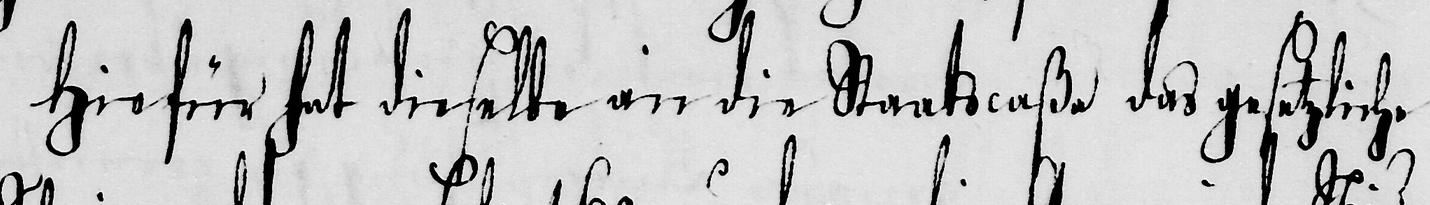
Hiefür hat dieselbe an die Staatscaßa das gesetzlic¬
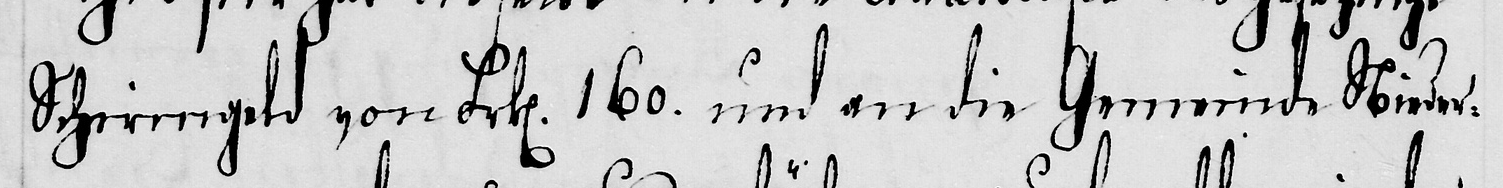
Schirmgeld von Frk[en]. 160. und an die Gemeinde Nieder¬
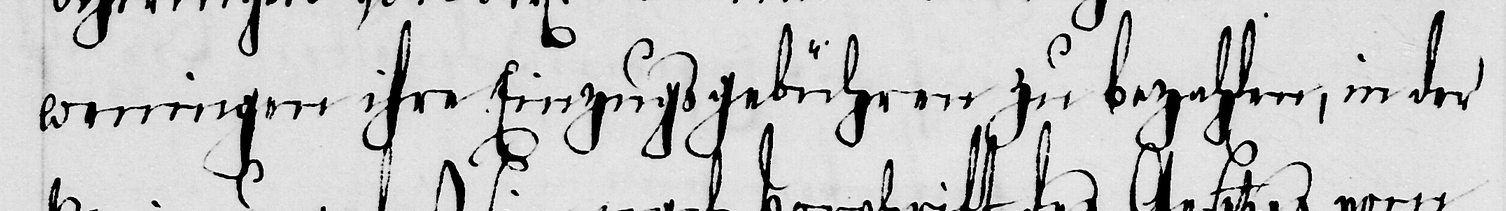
weningen ihre Einzugsgebühren zu bezahlen, in der
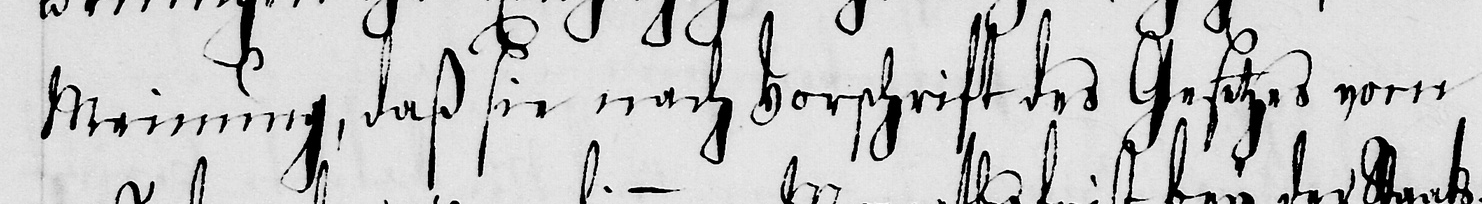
Meinung, daß sie nach Vorschrift des Gesetzes vom
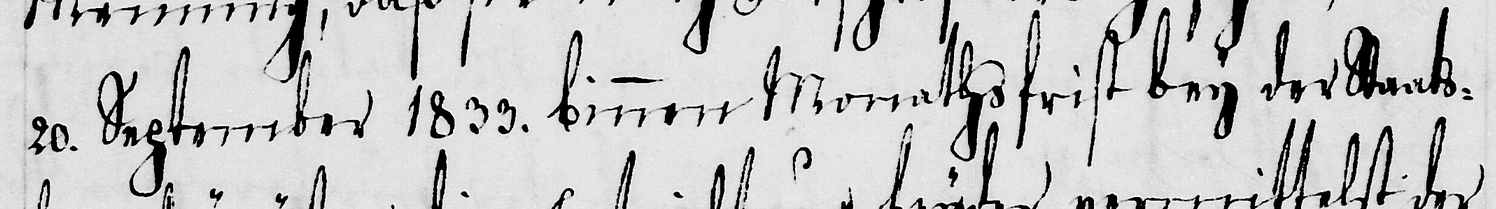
20. September 1833. binnen Monathsfrist bey der Staats¬
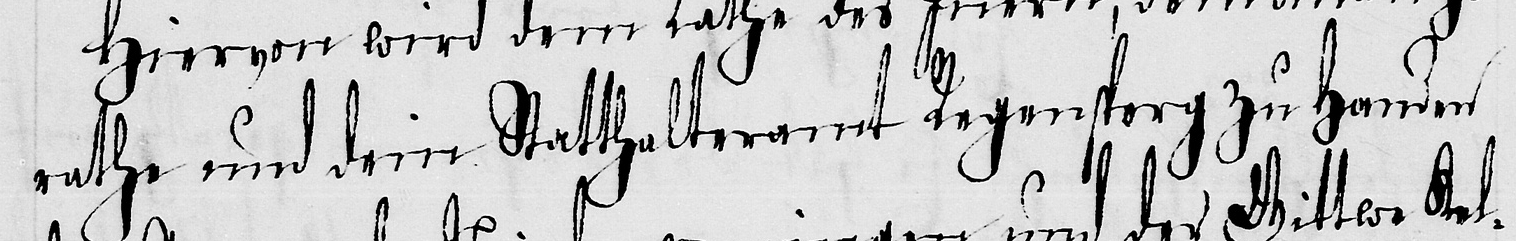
rathe und dem Statthalteramt Regensperg zu Handen
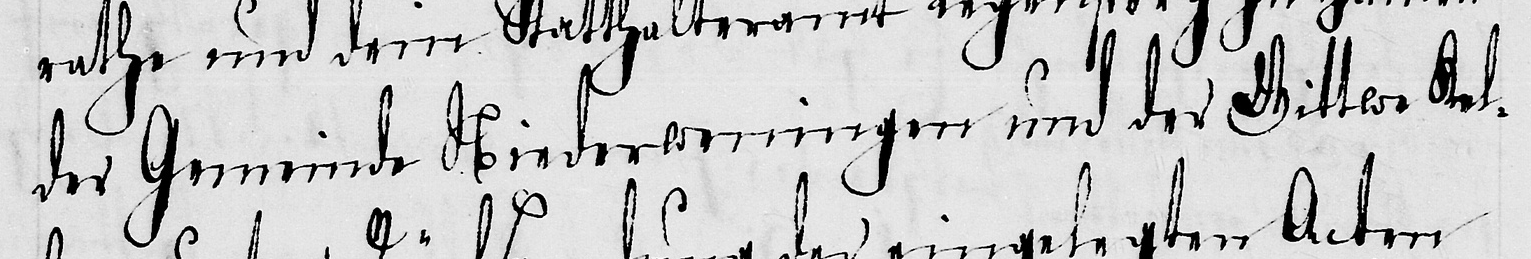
der Gemeinde Niederweningen und der Wittwe Kel¬
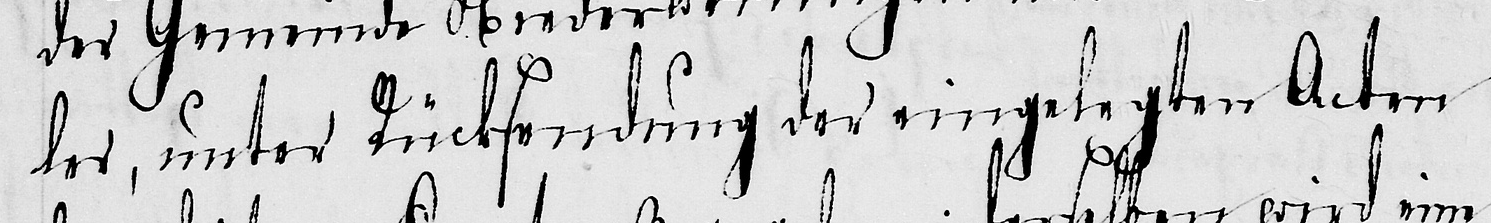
ler, unter Rücksendung der eingelegten Acten
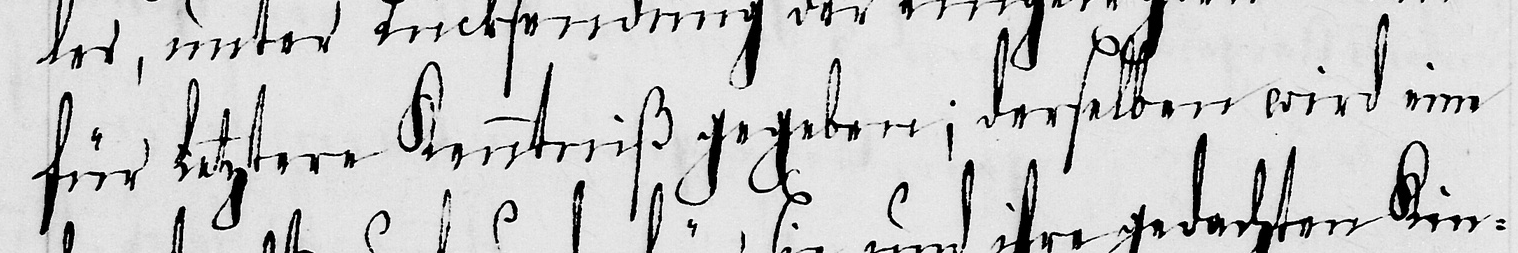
für Letztere Kenntniß gegeben; derselben wird eine
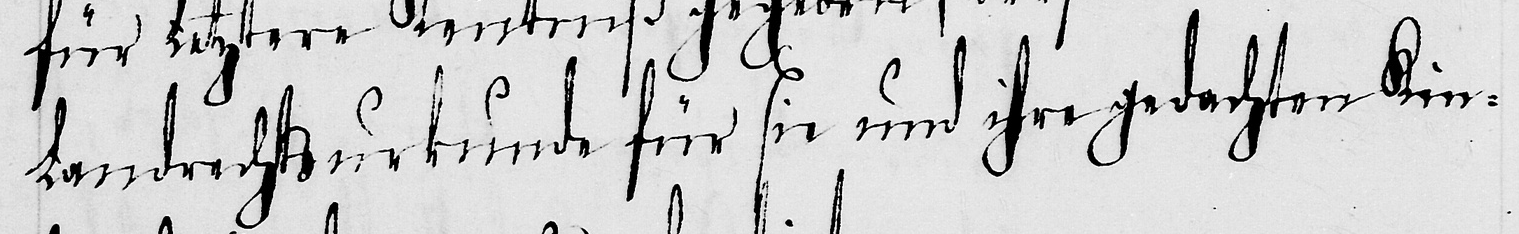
Landrechtsurkunde für sie und ihre gedachten Kin¬
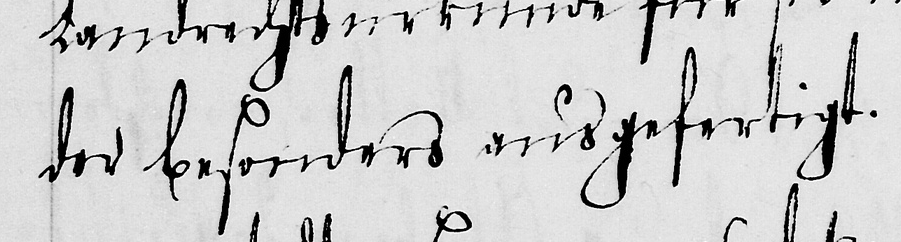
der besonders ausgefertigt.
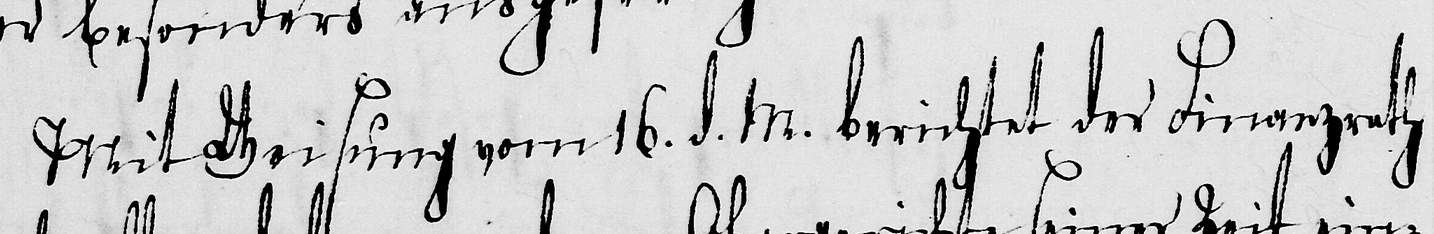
Mit Weisung vom 16. d. M. berichtet der Finanzrath
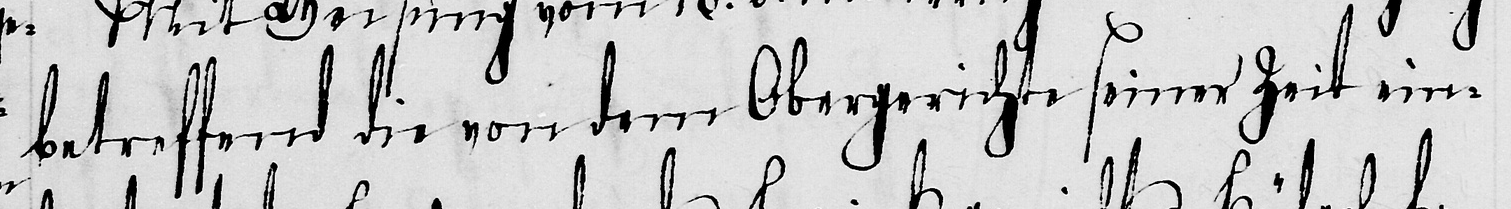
betreffend die von dem Obergerichte seiner Zeit ein¬
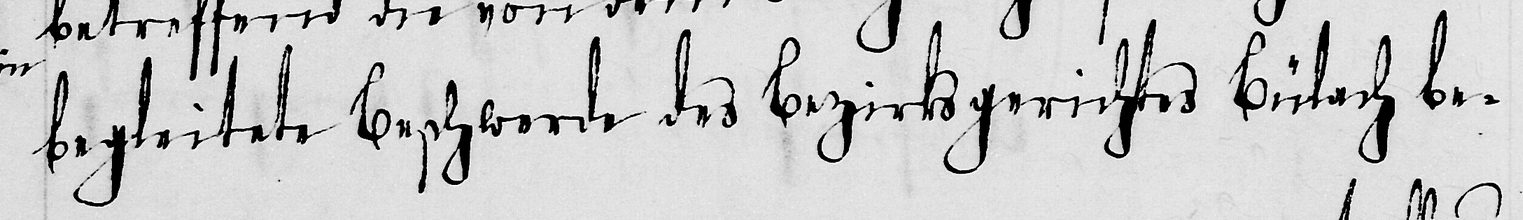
begleitete Beschwerde des Bezirksgerichtes Bülach be-
